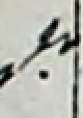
Do
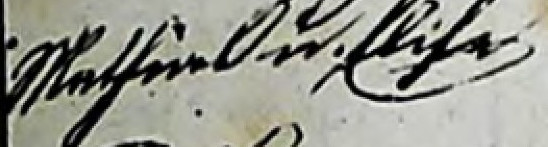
Mathias u. Elise
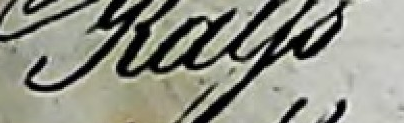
Kalss
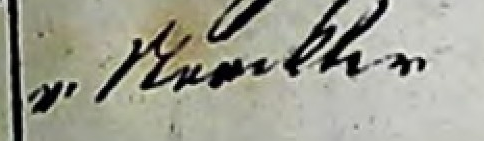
v. Neackler
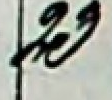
23
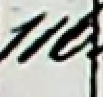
116
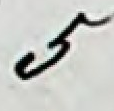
5
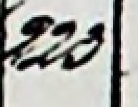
223
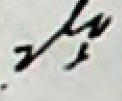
Do
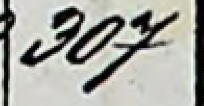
307
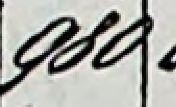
980
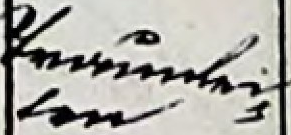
Traunlei„
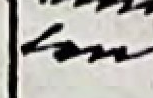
ten
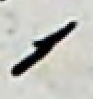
1
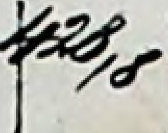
428,8
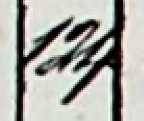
124
